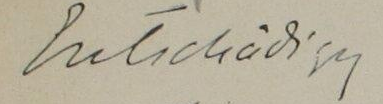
Entschädigung
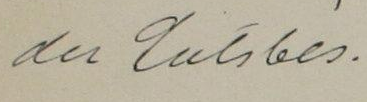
der Gutsbes.
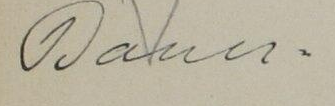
Bauer-
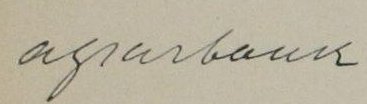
agrarbank
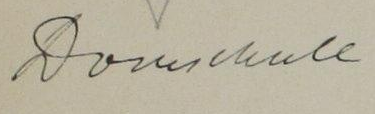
Domschule
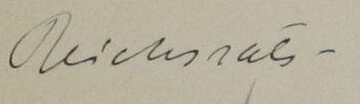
Reichsrats-
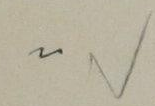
u.
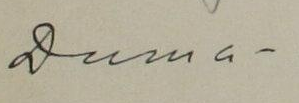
Duma-
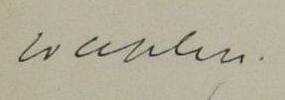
wahlen.
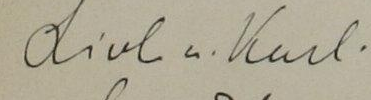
Livl. u. Kurl.
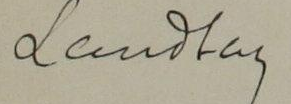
Landtag
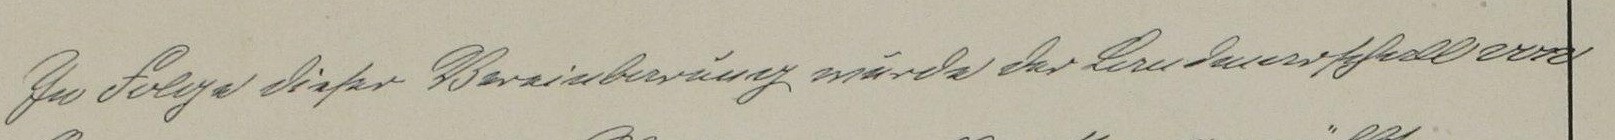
In Folge dieser Vereinbarung wurde der Landmarschall von
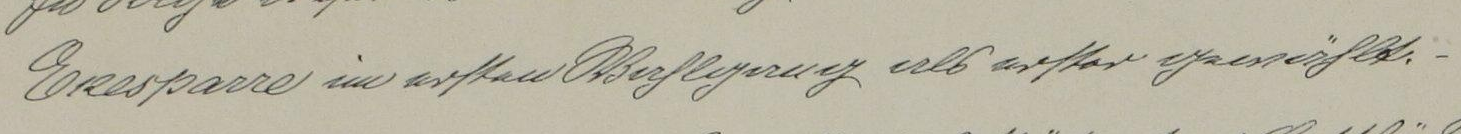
Ekesparre im ersten Wahlgang als erster gewählt.
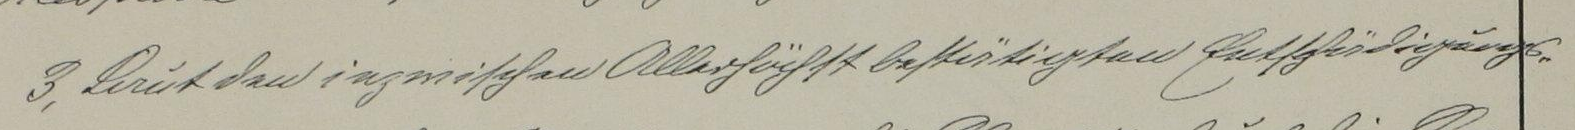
3. Laut inzwischen Allerhöchst bestätigten Entschädigungs-
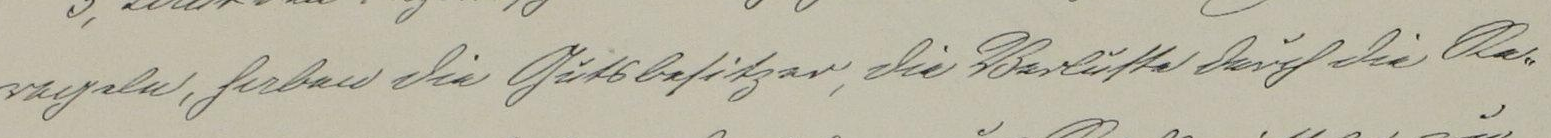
regeln, haben die Gutsbesitzer, die Verluste durch die Re-
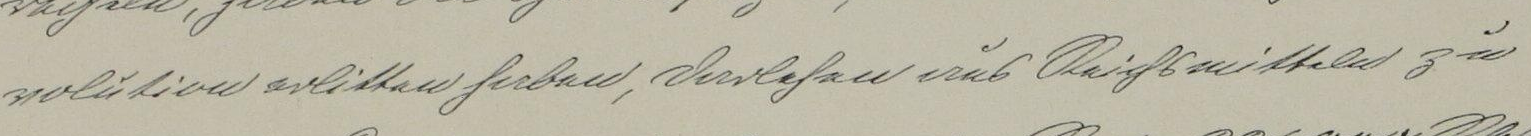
volution erlitten haben, Darlehen aus Reichsmitteln zu
